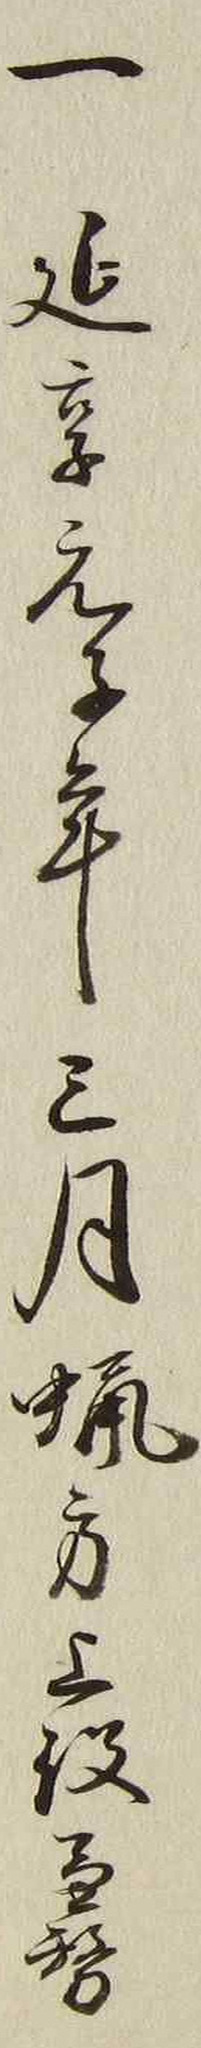一延享元子年三月蝋方上役兼務

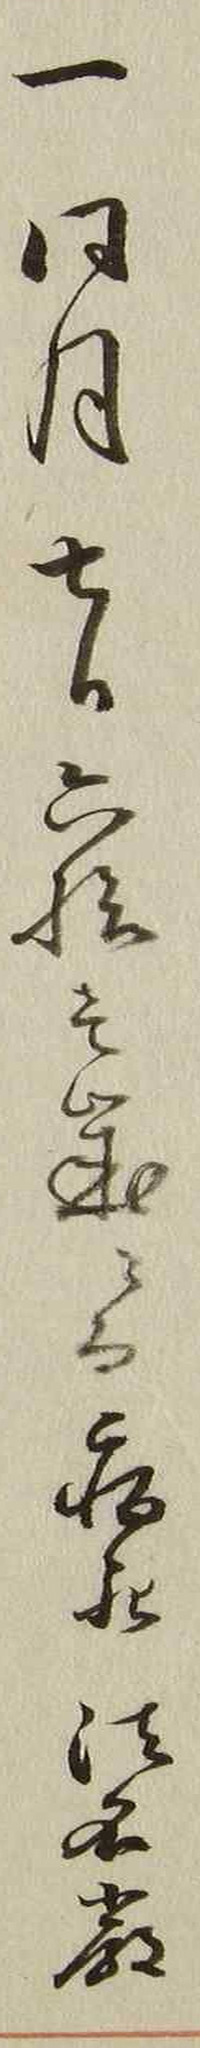一同月七日六拾壱歳ニて病死法名厳
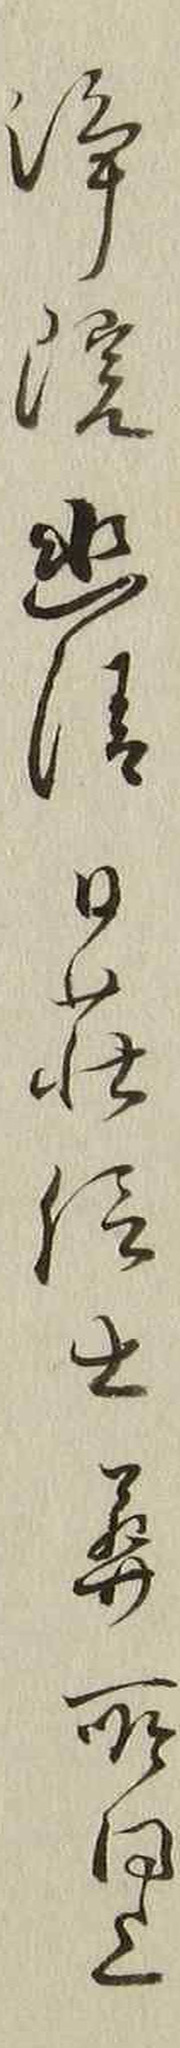浄院幽清日荘信士葬所同上
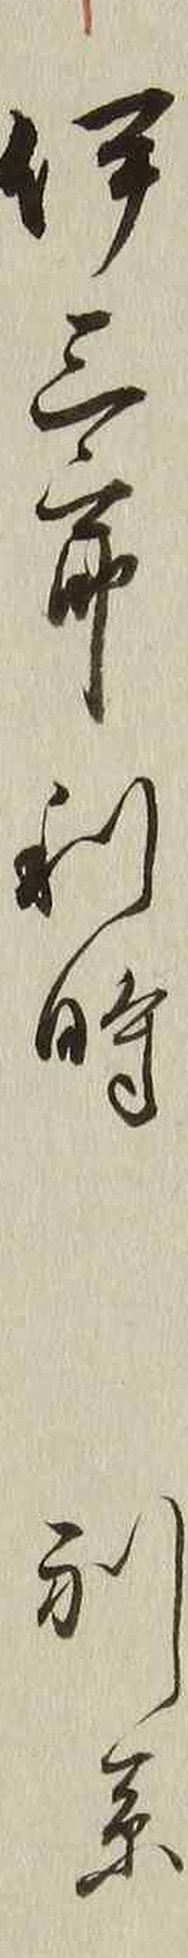伊三郎利時別系
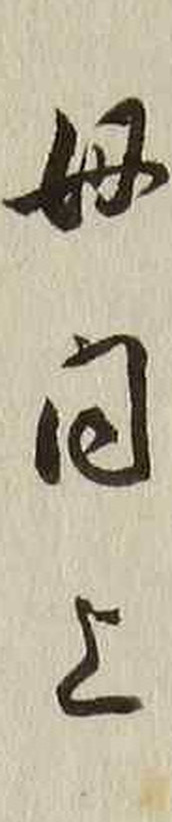母同上
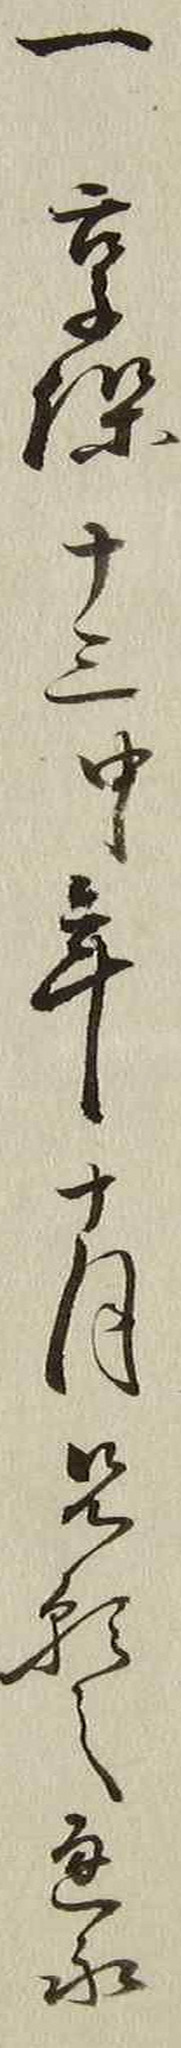一享保十三申年十月兄願い之通り永
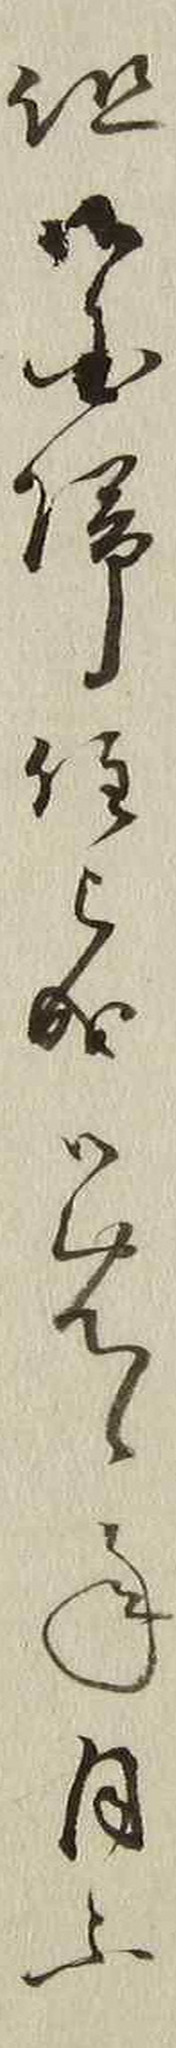但し御国帰住成られ御免候年月不
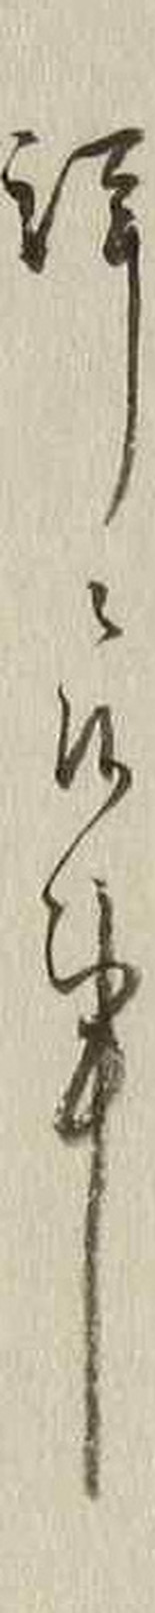詳ニ候事
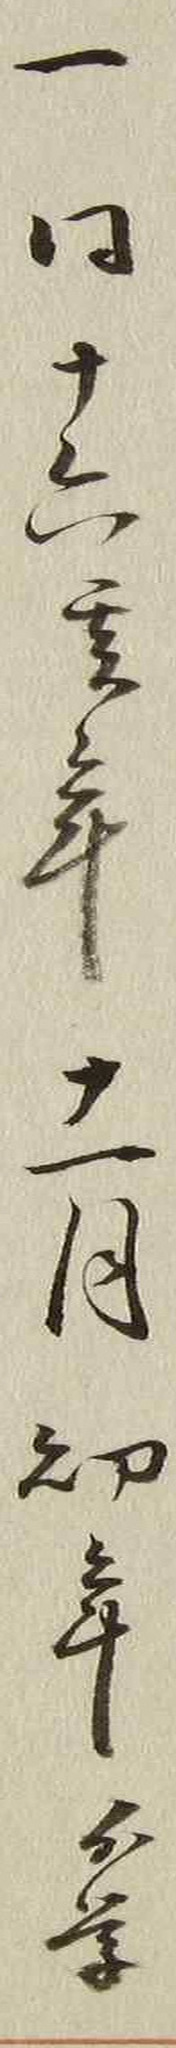一同十六亥年十一月幼年より学
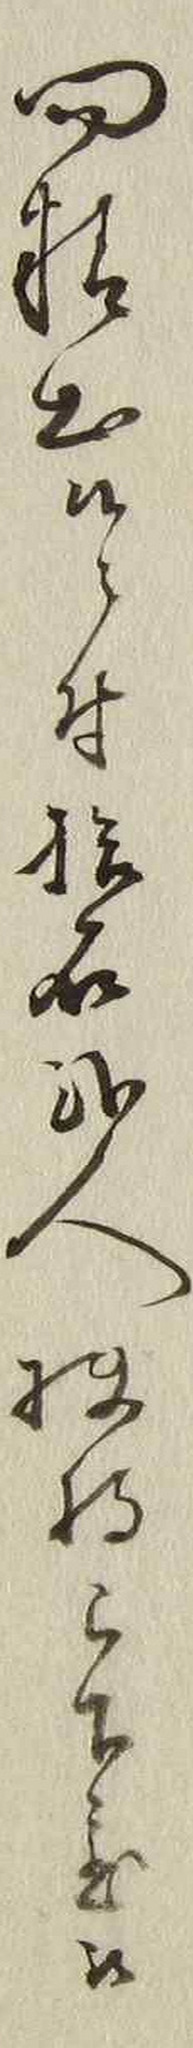問精出し候ニ付き拾石弐人扶持下し置候

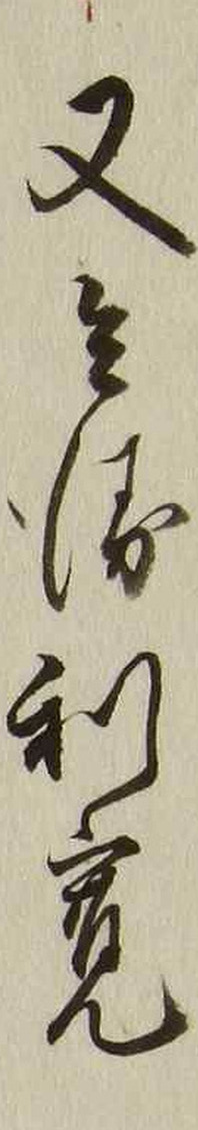又兵衛利寛
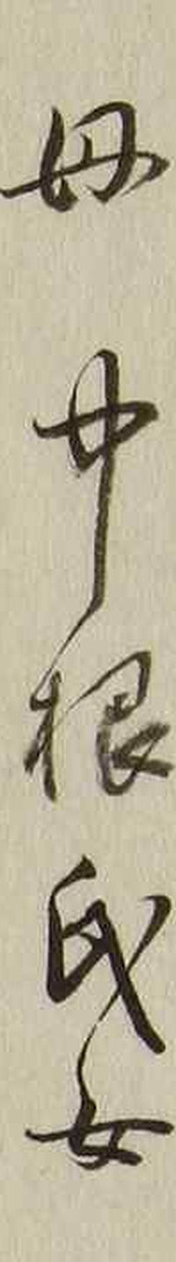母中根氏女
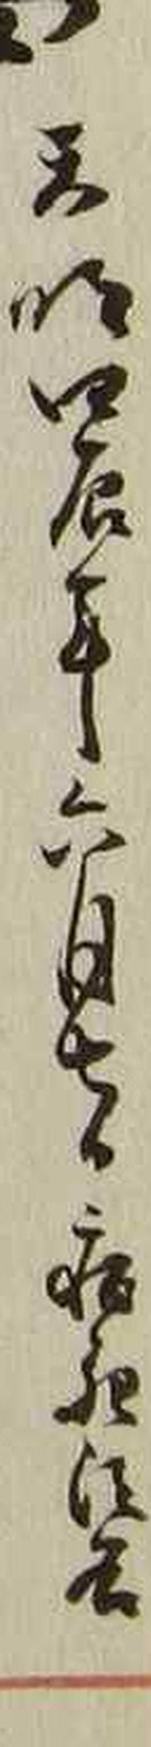天明四辰年六月七日病死法名
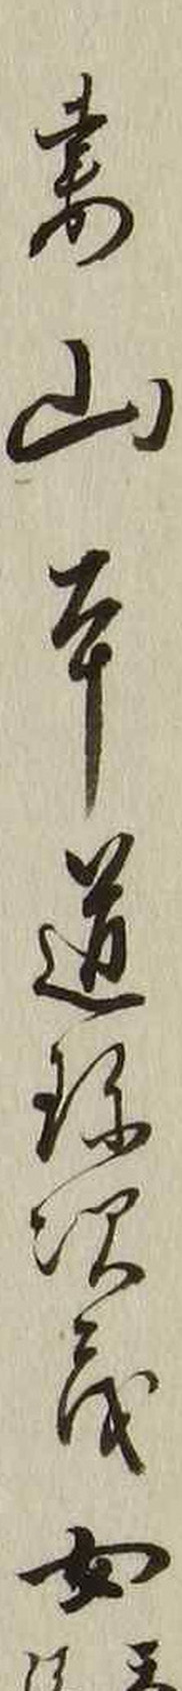妻山本道珍次茂女
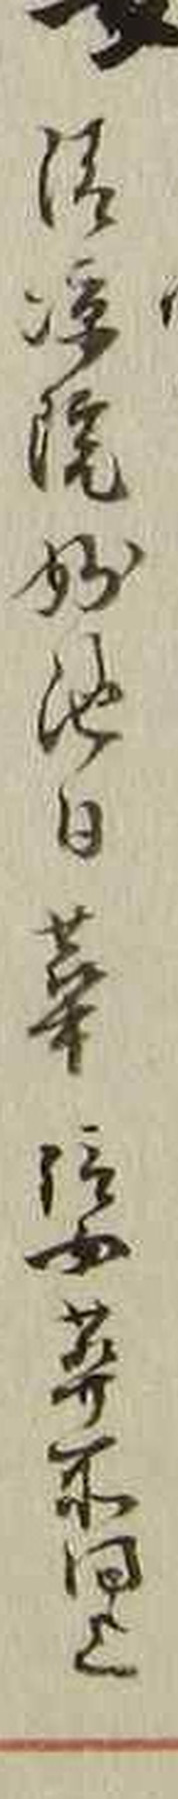清淳院妙池日葦葬所同上
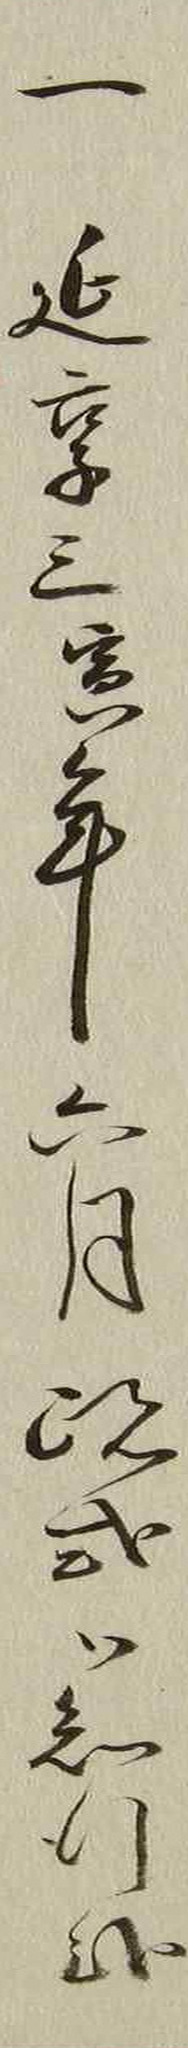一延享三寅年六月跡式御知行弐
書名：諸士系譜　巻之20　い之部20
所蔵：会津若松市立会津図書館
